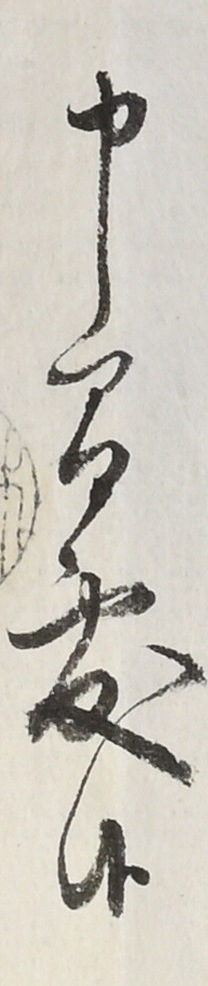申間敷候
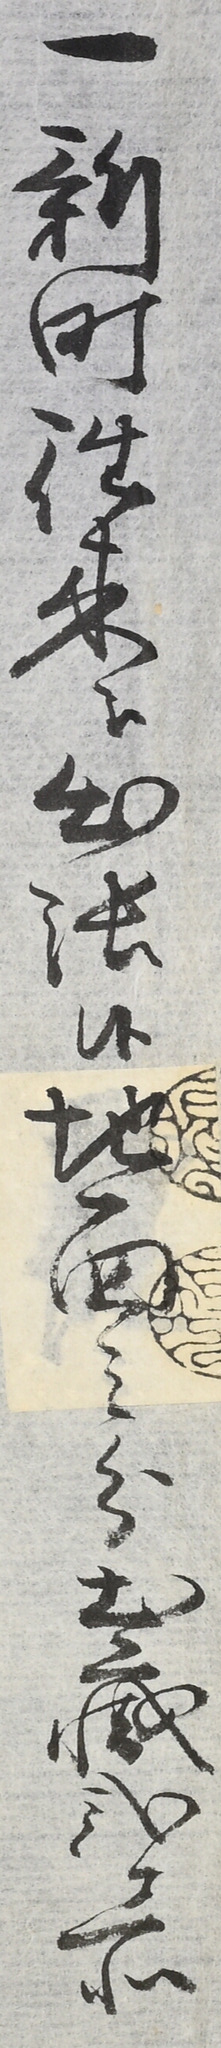一新町往来江出張候地面之分土蔵弐ヶ所
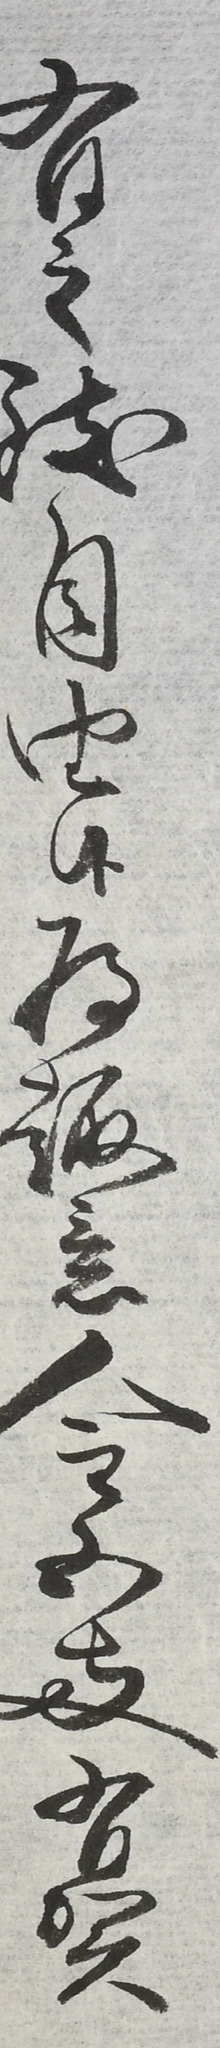有之地自由候為趣意金五両有賀

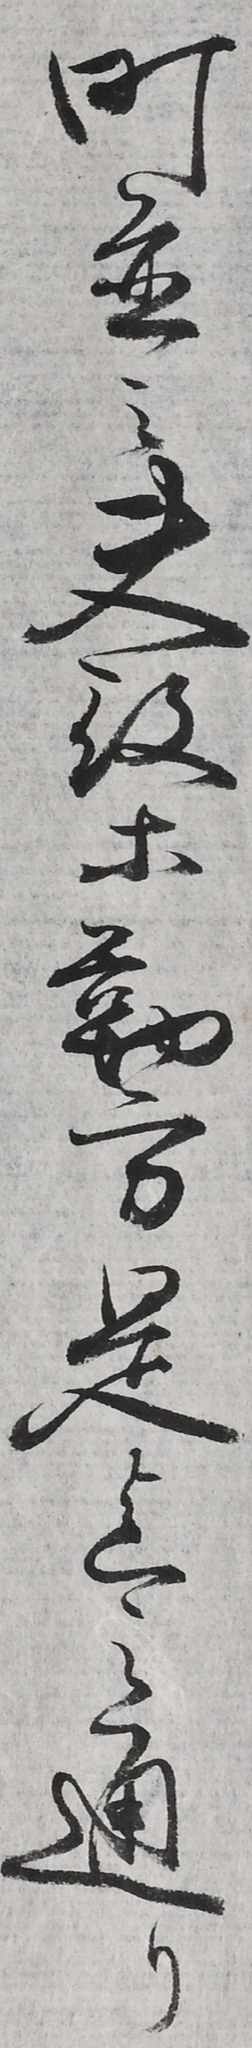町並之夫役等勤方是迄之通り
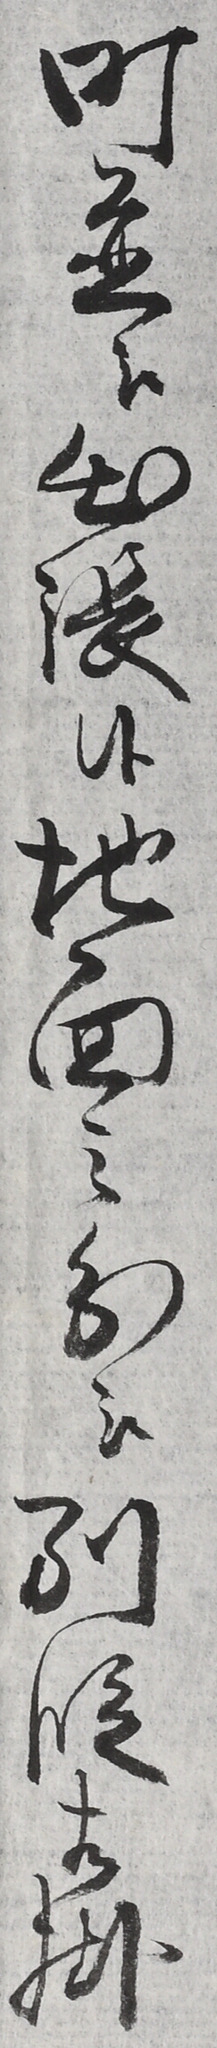町並江出張候地面之分江別段相掛
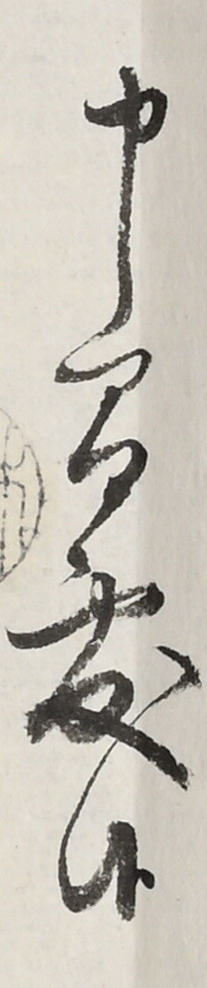申間敷候
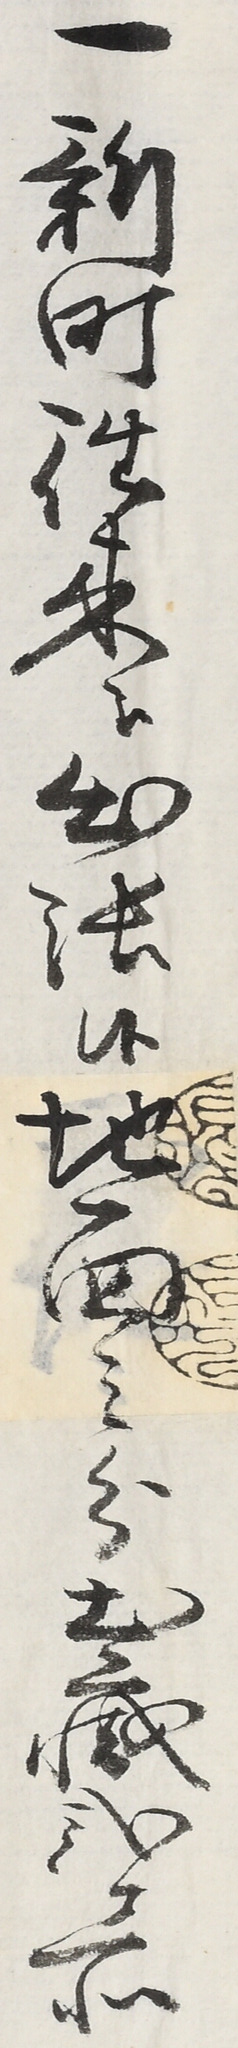一新町往来江出張候地面之分土蔵弐ヶ所
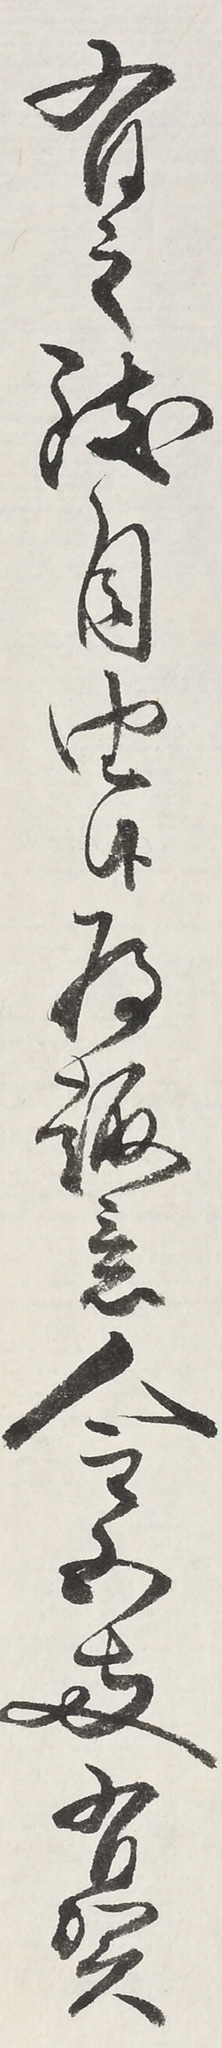有之地自由候為趣意金五両有賀
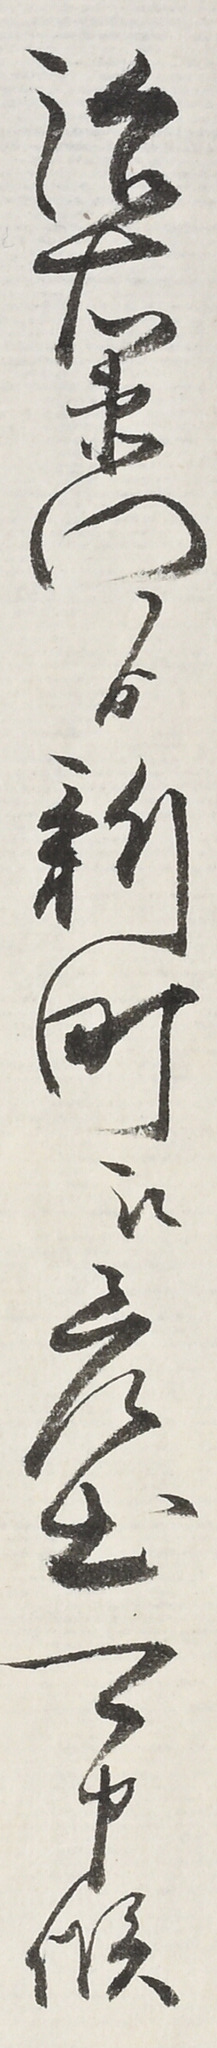治右衛門ゟ新町江差出可申候
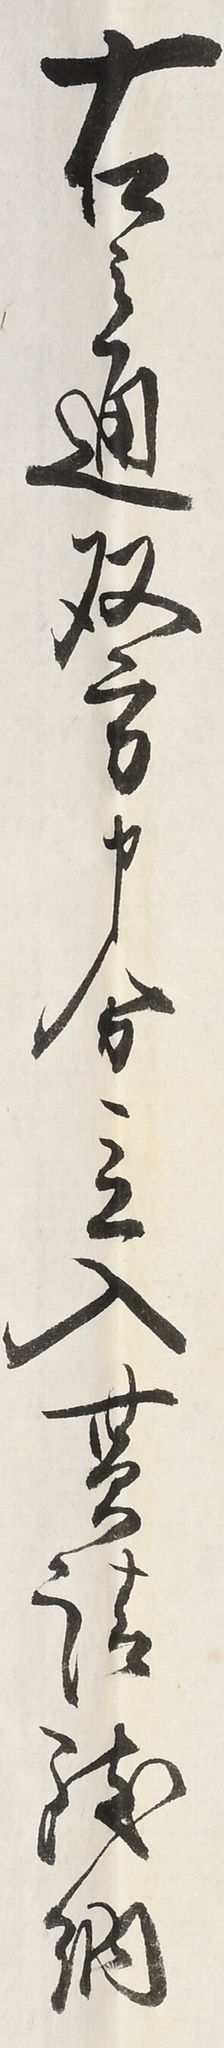右之通双方申分立入貰請致納
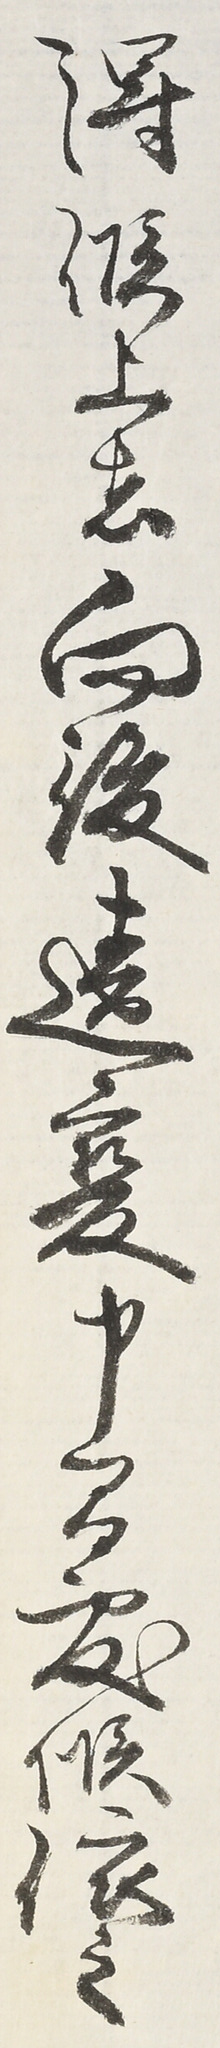得候上者向後違変申間敷候依之
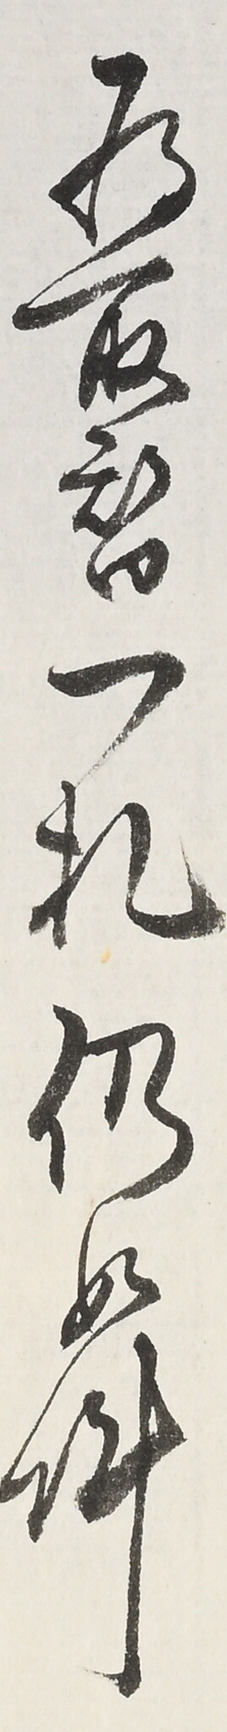為取替一札仍如件
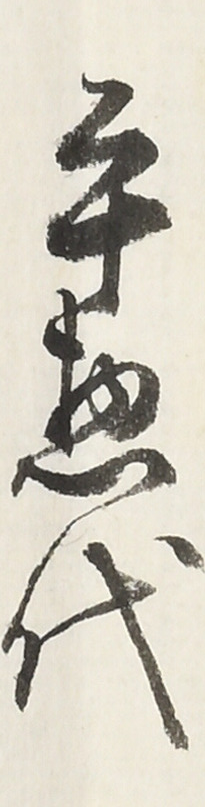平惣代
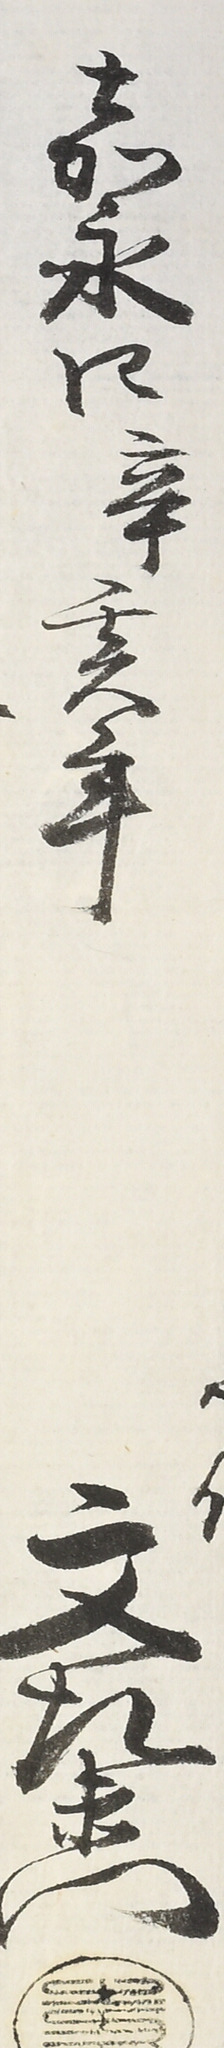嘉永四辛亥年文左衛門㊞
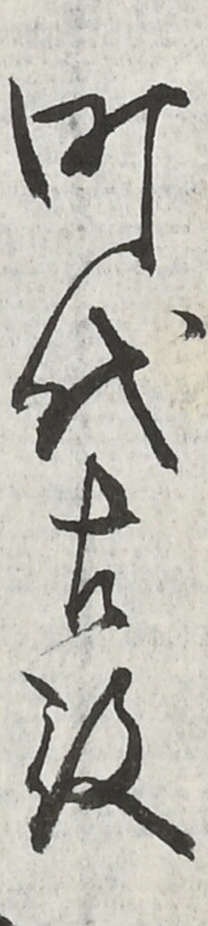町代古役

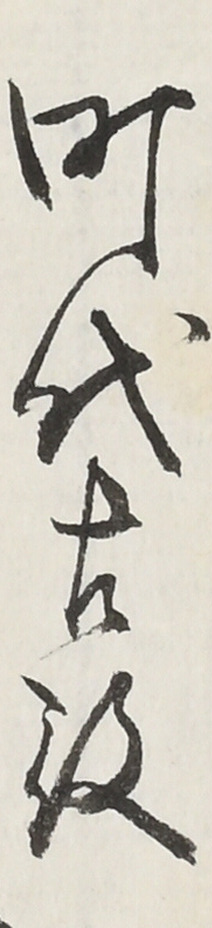町代古役
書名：為取替一札之事
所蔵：伊那市立高遠町図書館・合同会社AMANE
